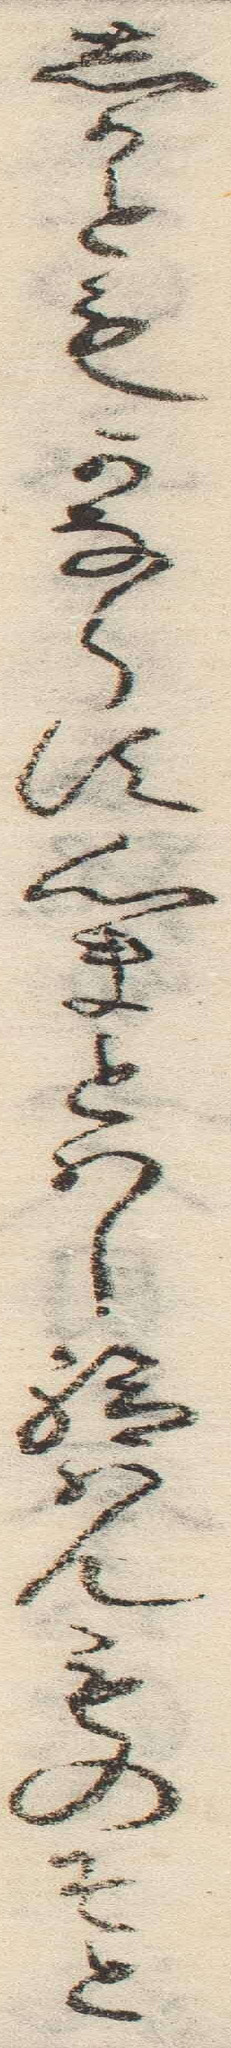しかともかならす心まとはし給はんものそと
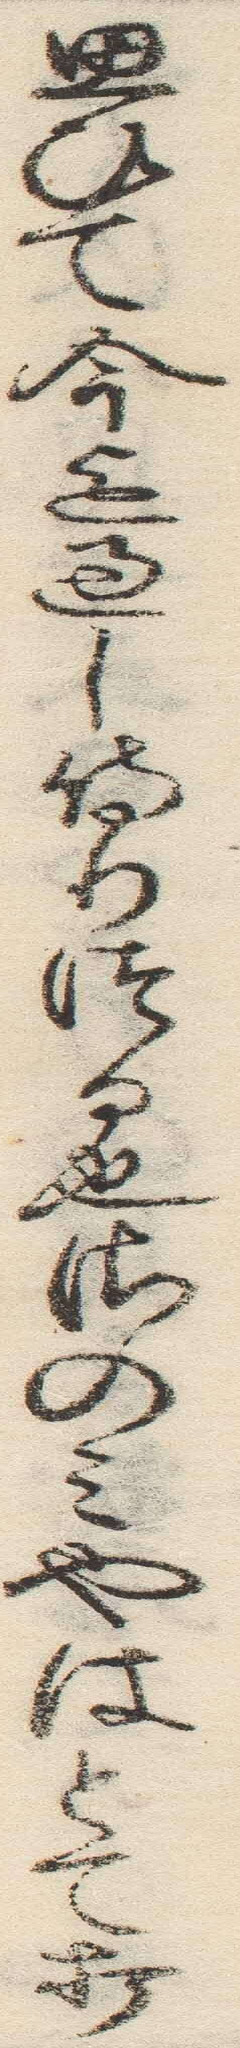思ひて今迄過し侍りつる也さのみやはとて打
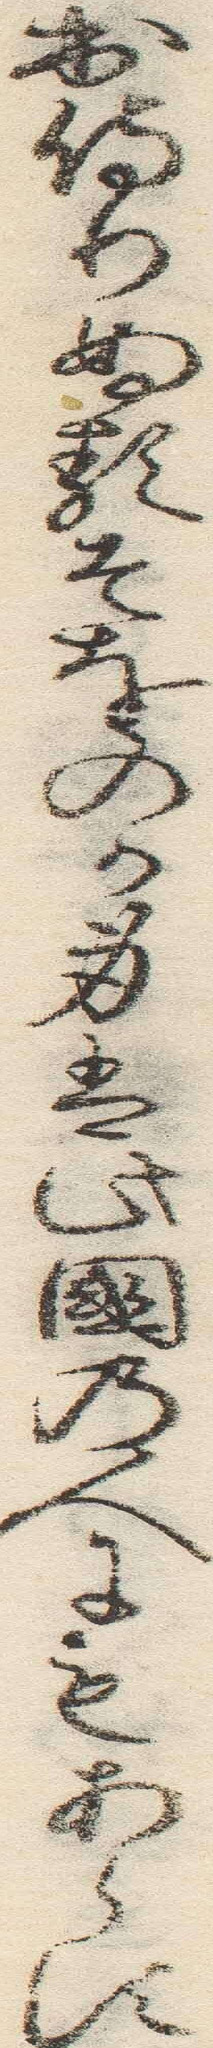出侍りぬるそをのか身は此国の人にもあらす
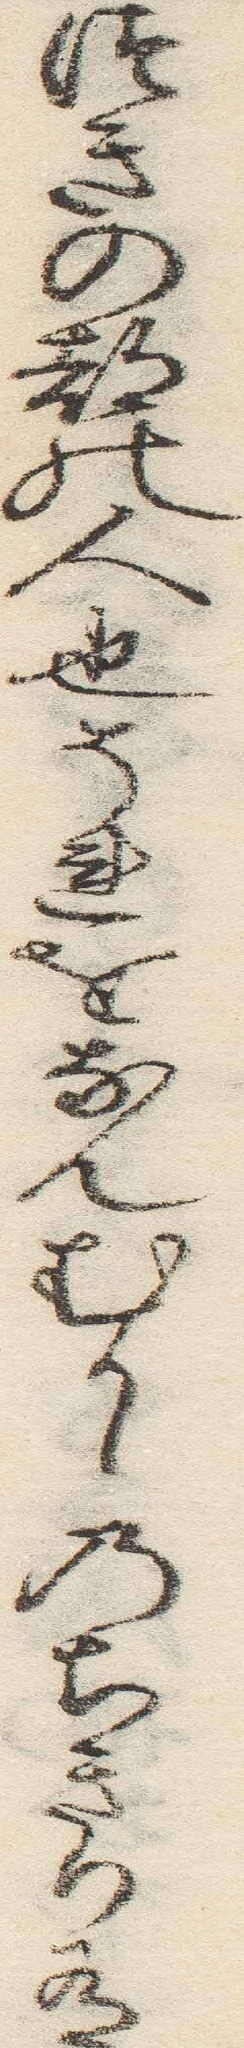つきの都の人也それをなんむかしのちきり有
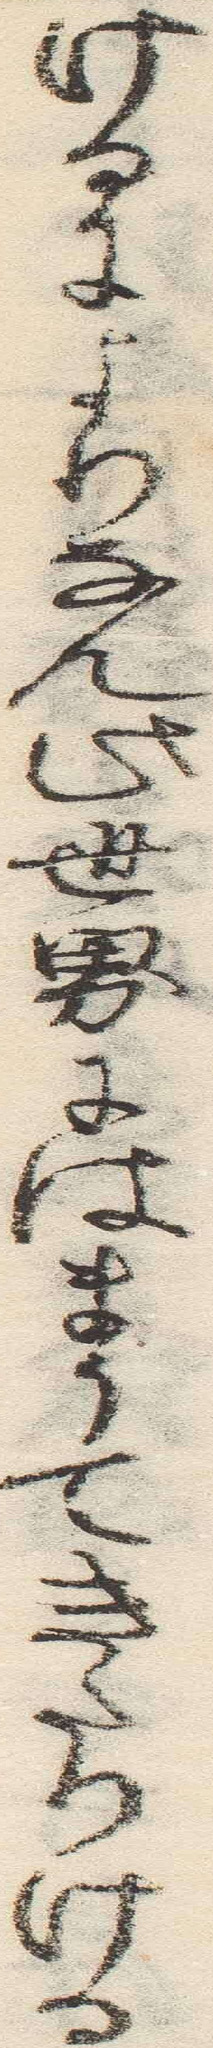けるによりなん此世界にはまうてきたりける
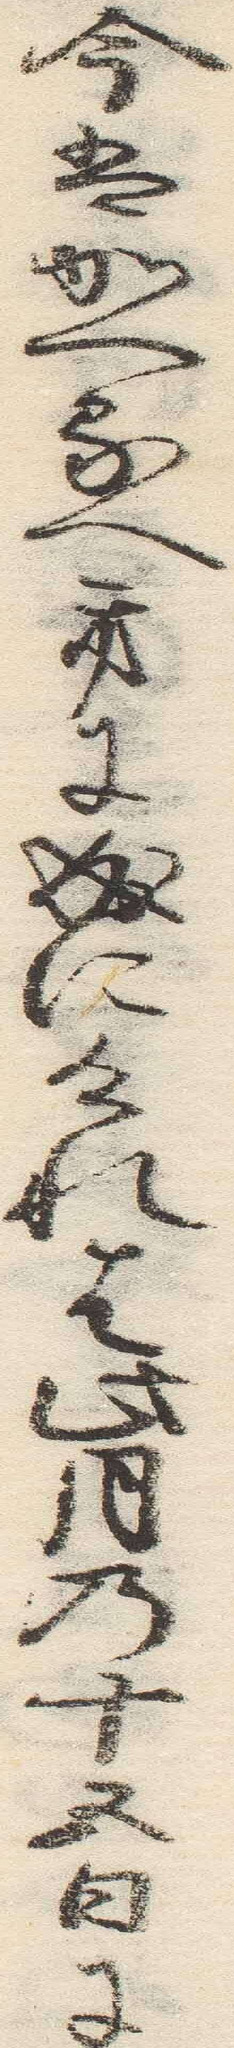今はかへるへきに成にけれは此月の十五日に
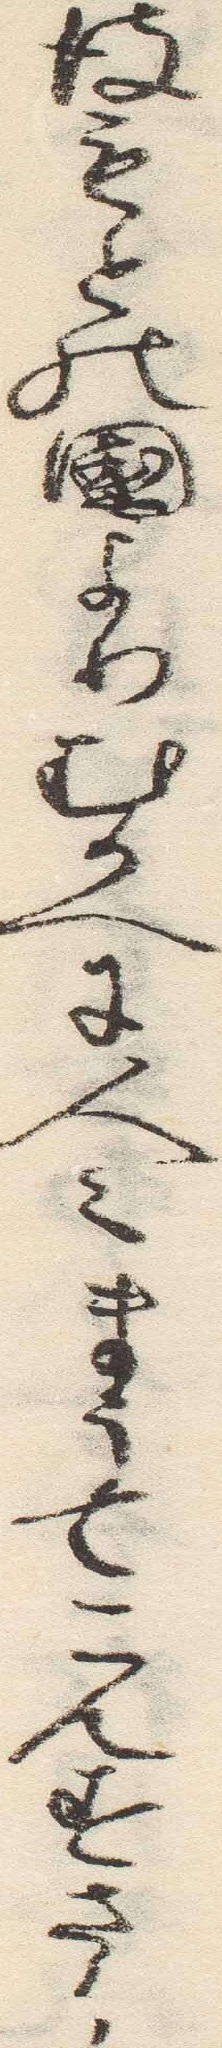彼もとの国よりむかへに人々まうてこんすさら
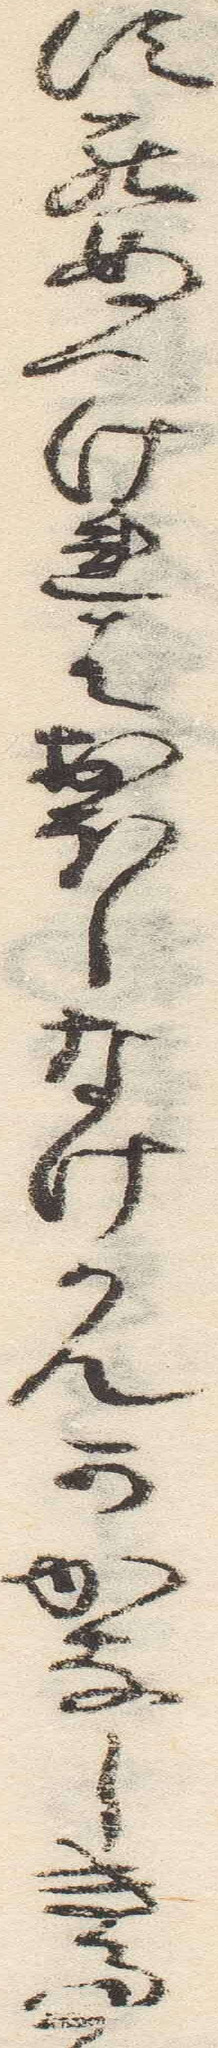す罷ぬへけれはおほしなけかんかかなしき事
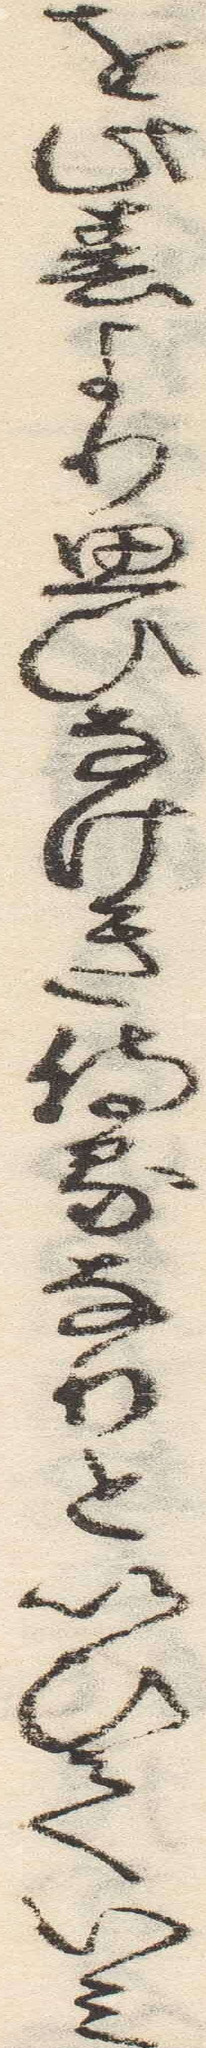を此春より思ひなけき侍るなりといひていみ
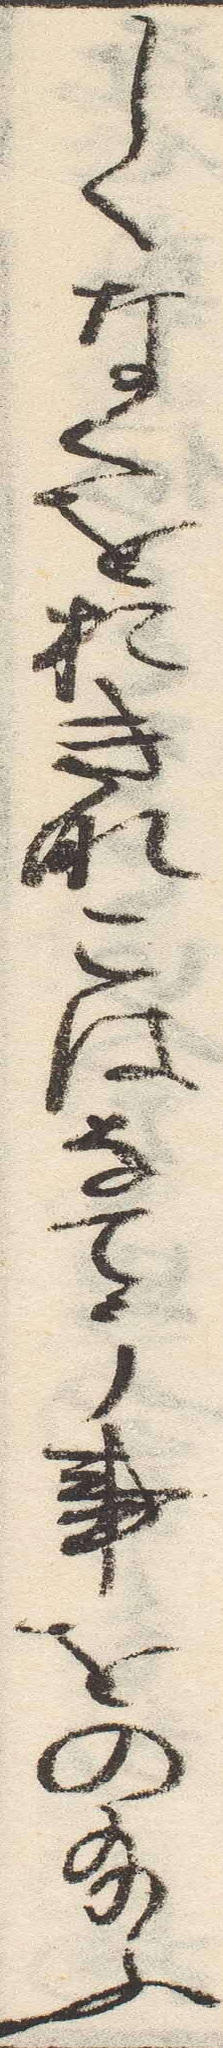しくなくをおきなこはなてう事をの給ふ
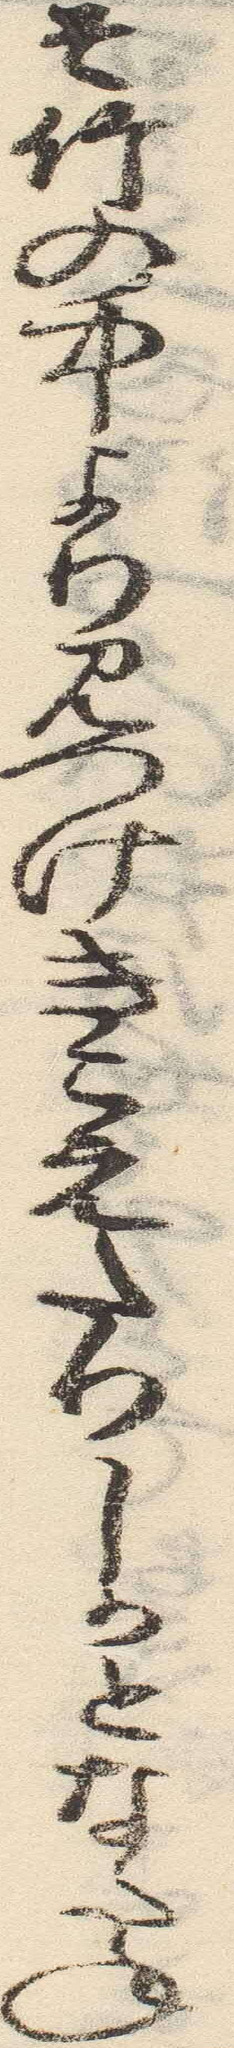そ竹の中より見つけきこえたりしかとなたね
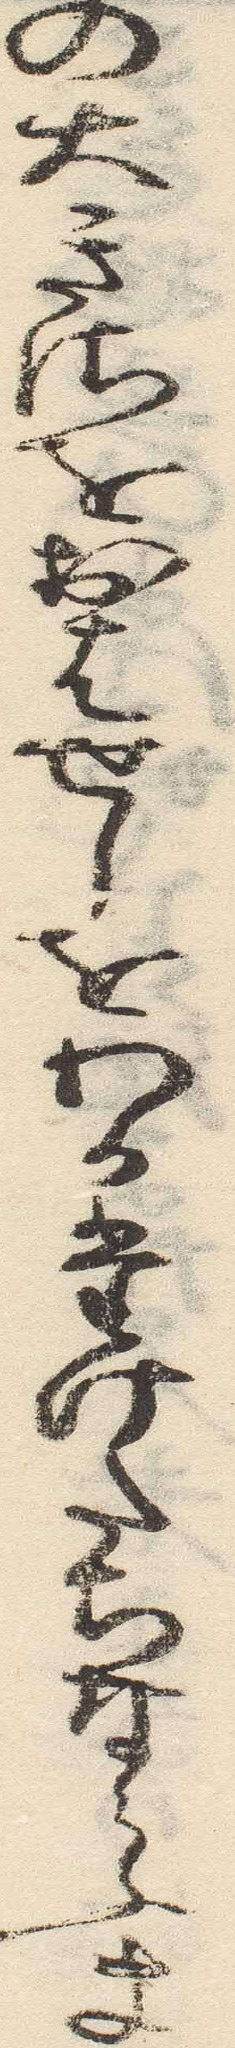の大きさをおはせしをわかたけたちならふま
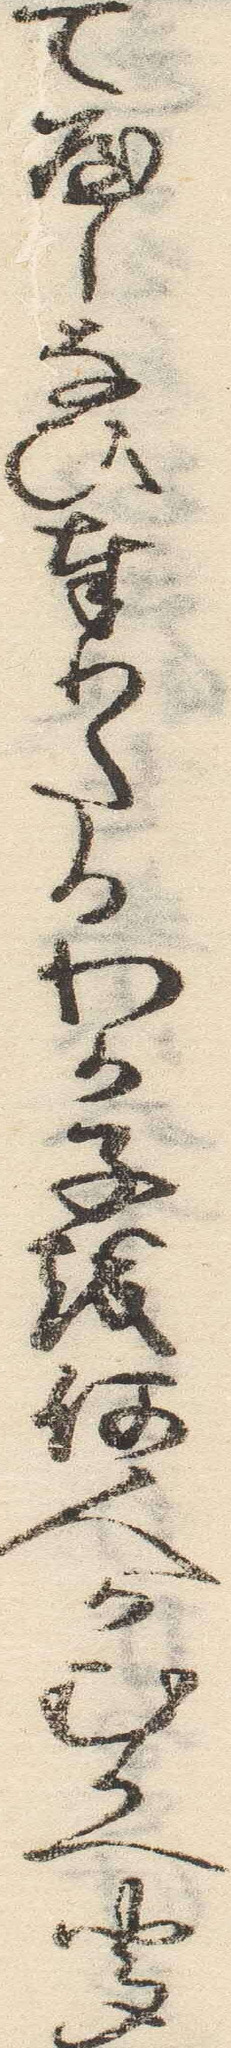てやしなひ奉りたるわか子をなん何人かむかへ聞
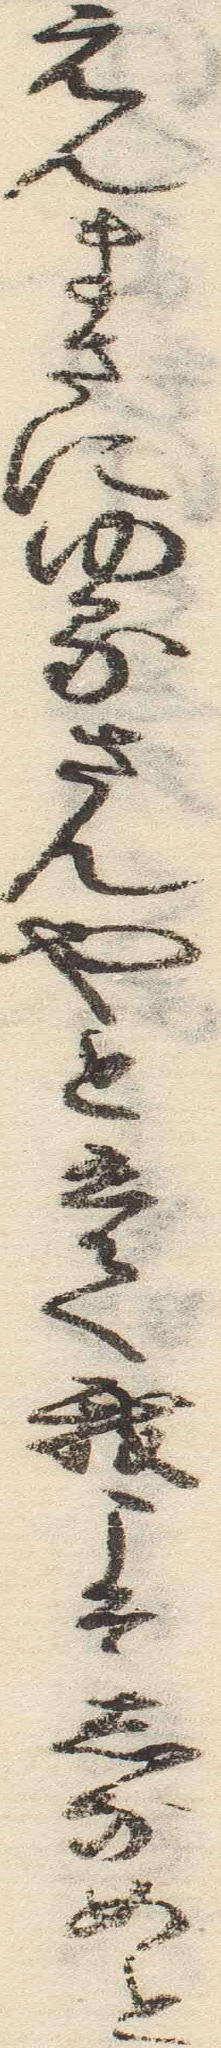えんまさにゆるさんやと云て我こそしなめと
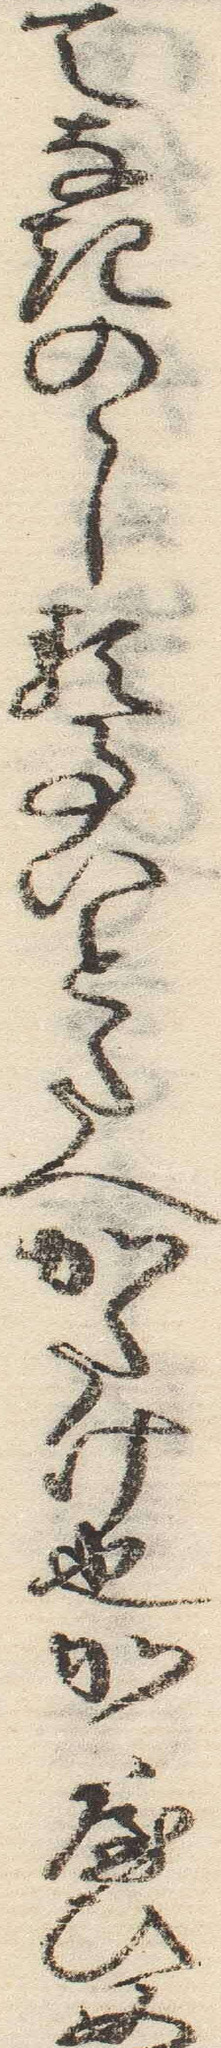てなきのゝしる事いとたへかたけ也かくやひめ
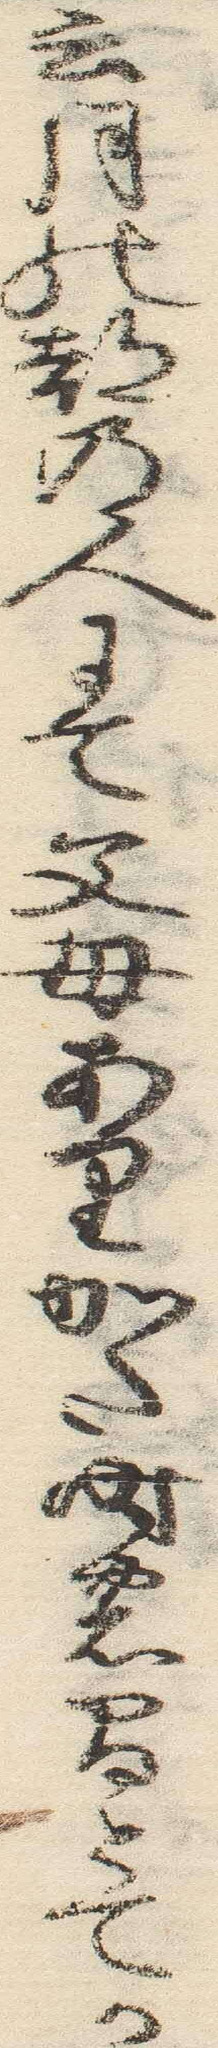云月の都の人にて父母ありかた時の間とてか
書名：竹取物語
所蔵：東京学芸大学附属図書館 国文学研究資料館
